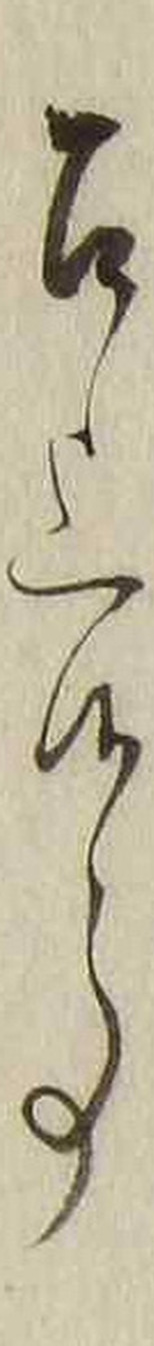召上候事

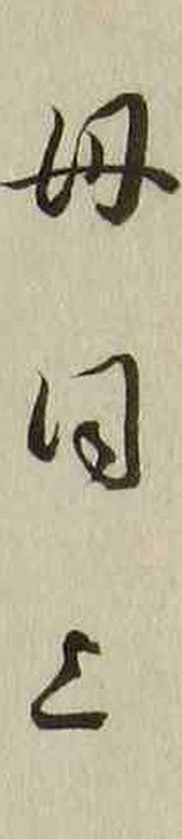母同上
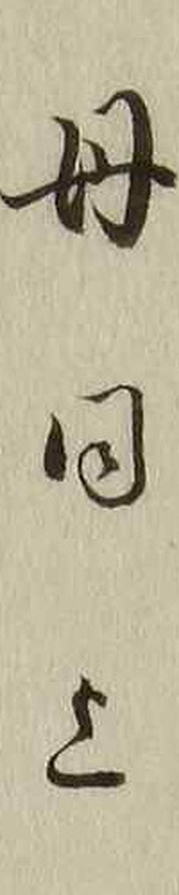母同上
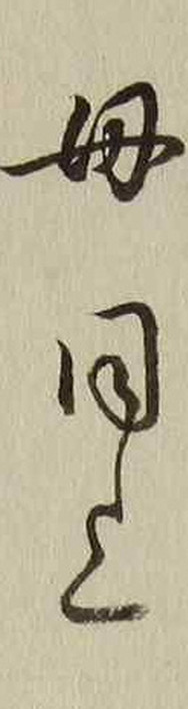母同上
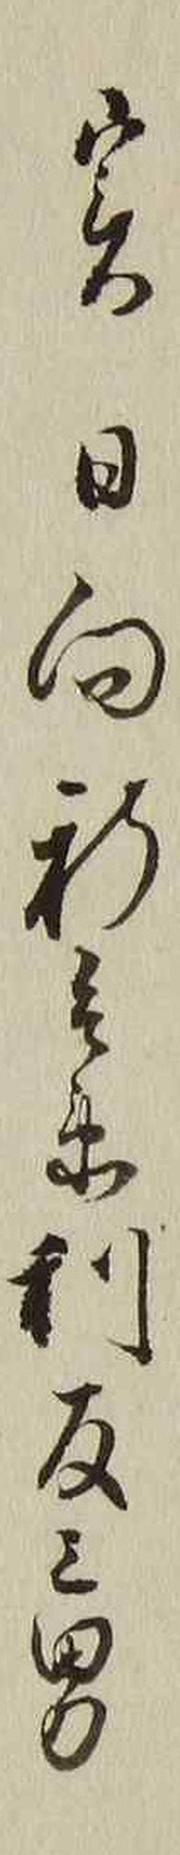実日向新兵衛利友三男
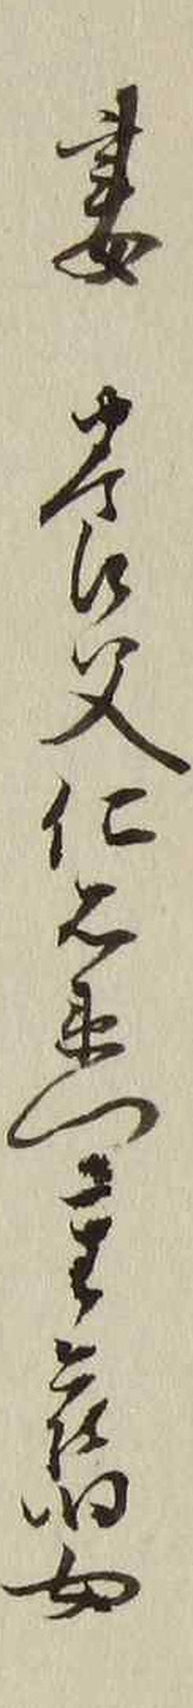妻養父仁右衛門重舊女

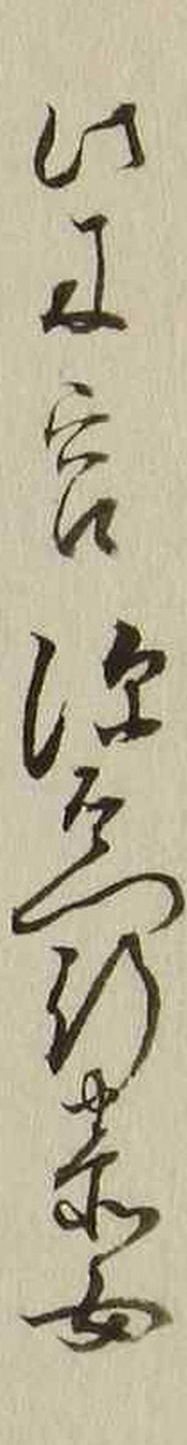此木宮深右衛門行泰女
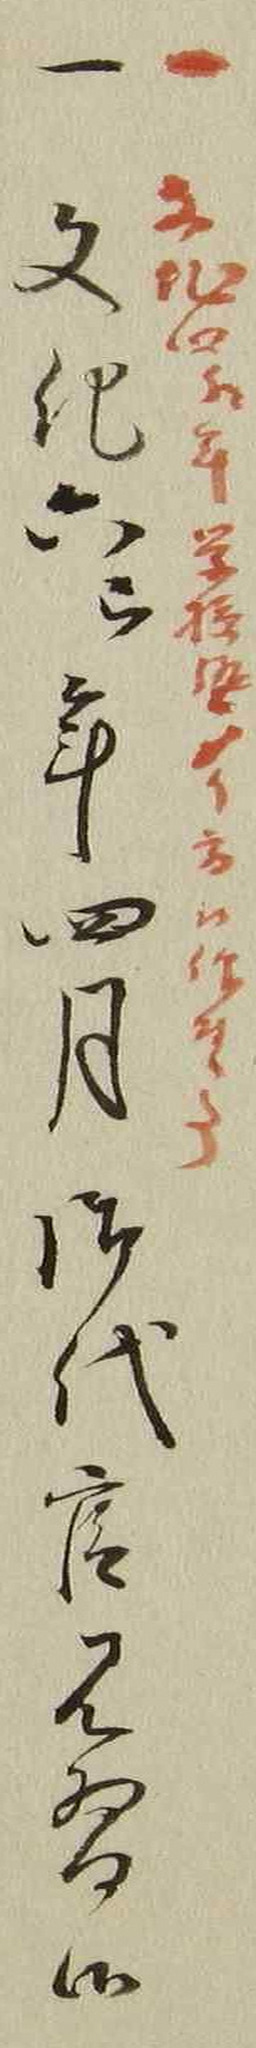一文化六巳年四月御代官見習御
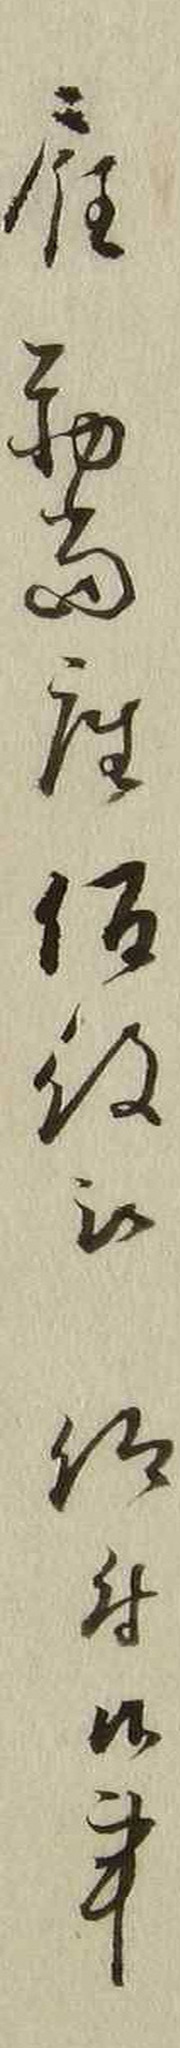雇勤当座仮役被仰付候事
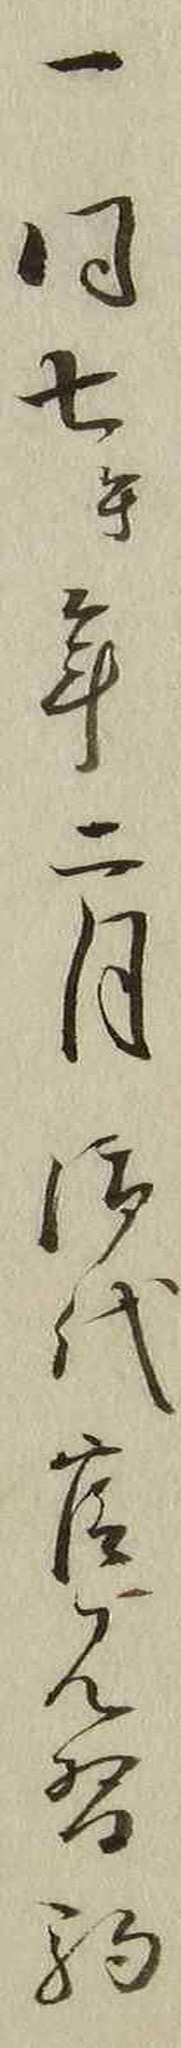一同七午年二月御代官見習駒
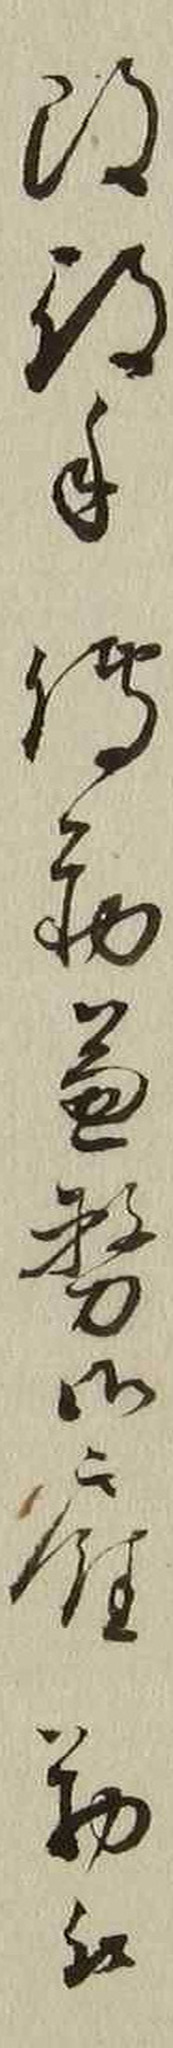改役手伝勤兼務御雇勤被
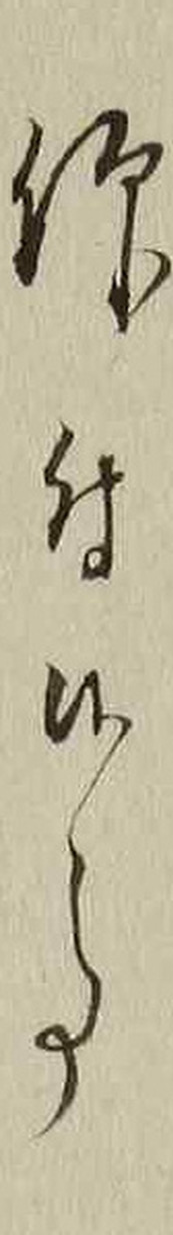仰付候事
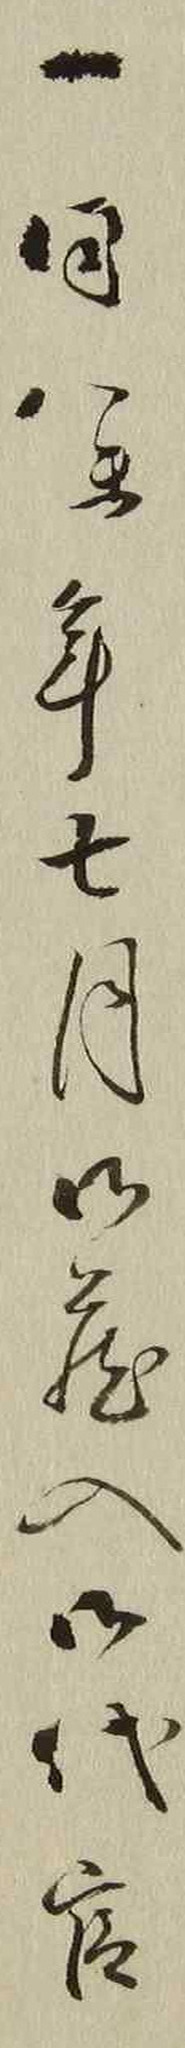一同八未年七月御蔵入御代官
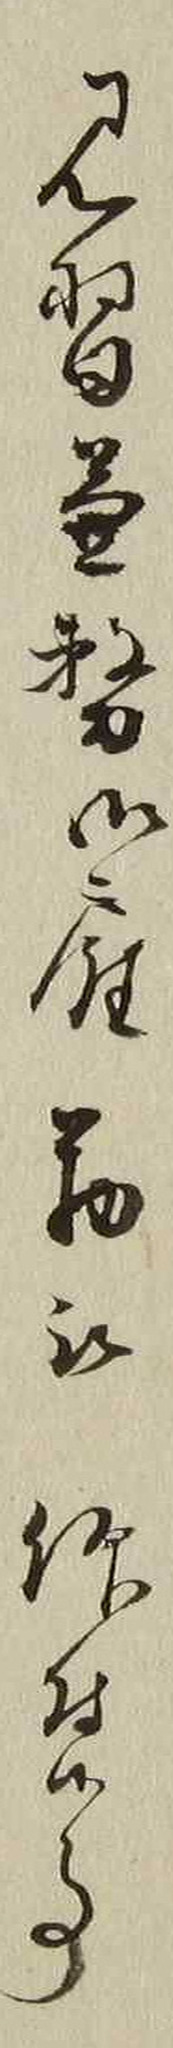見習兼務御雇勤被仰付候事
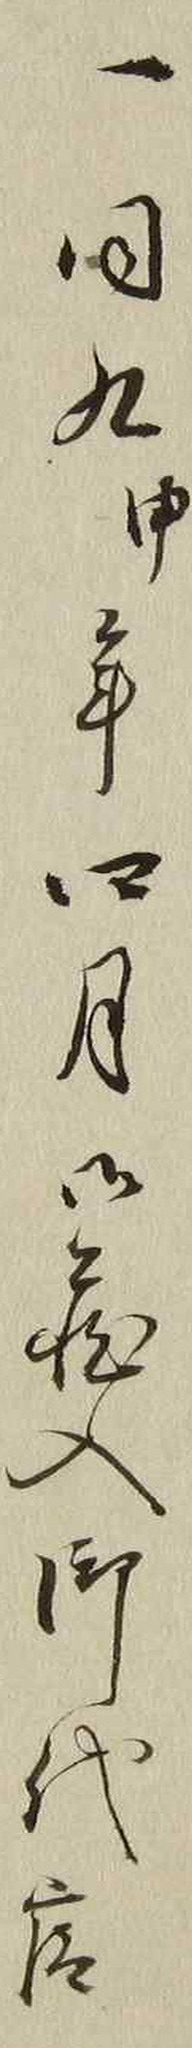一同九申年四月御蔵入御代官
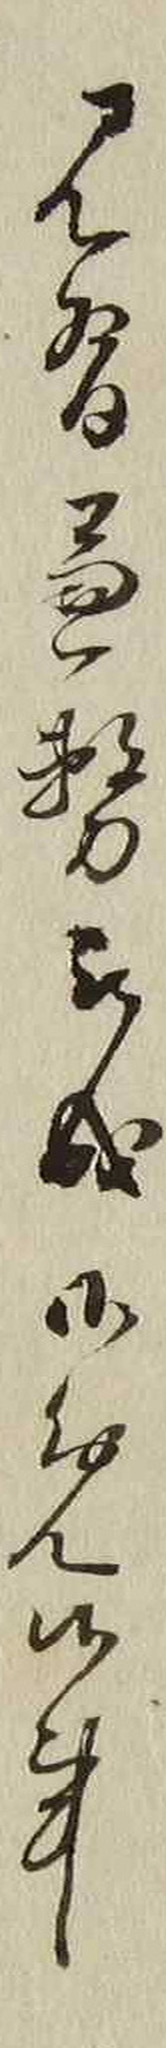見習兼務被成御免候事
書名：諸士系譜　巻之129　た之部5
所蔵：会津若松市立会津図書館
